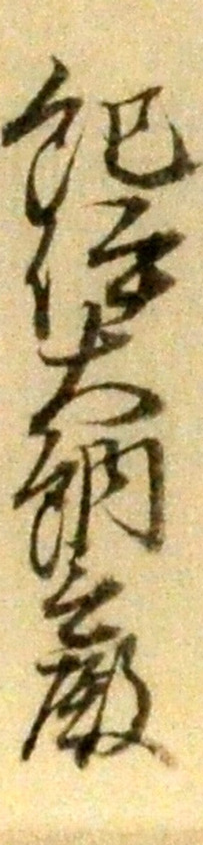紀伊大納言殿
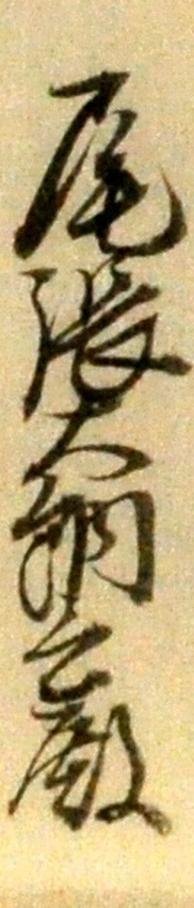尾張大納言殿
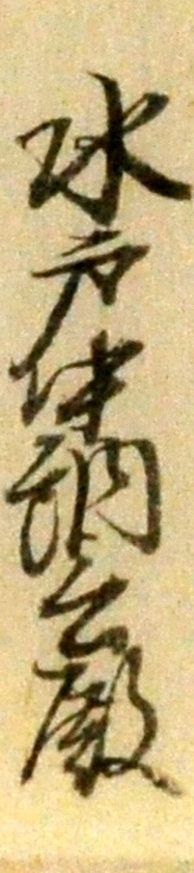水戸中納言殿
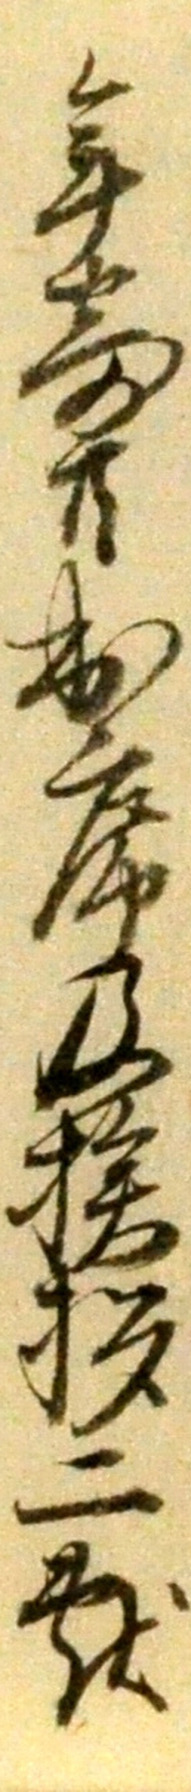年寄共出席及挨拶二献
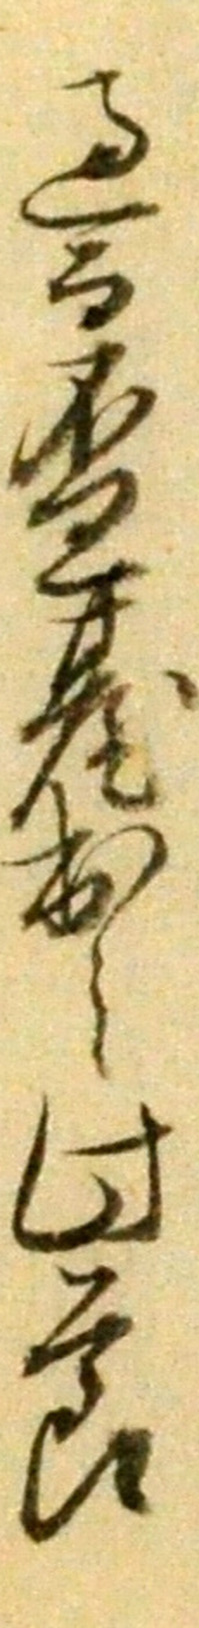過而盃台出之此節

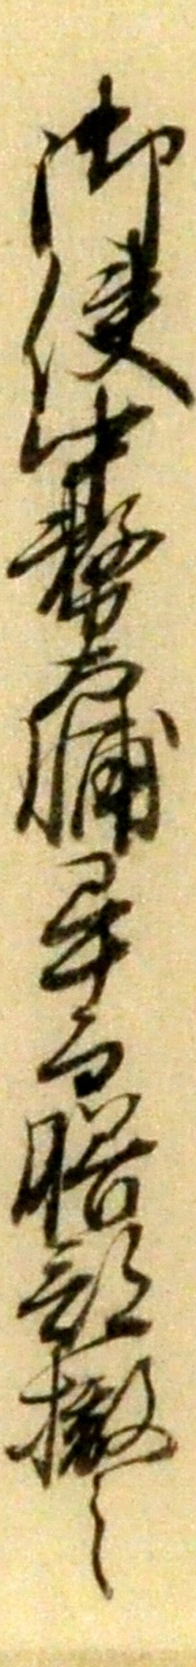御使中務大輔畢而膳部撤之
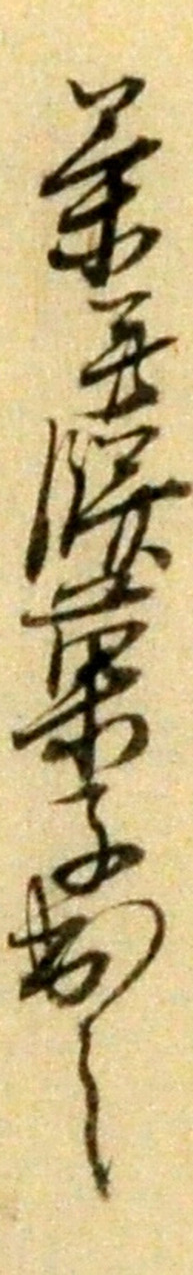茶并餅菓子出之
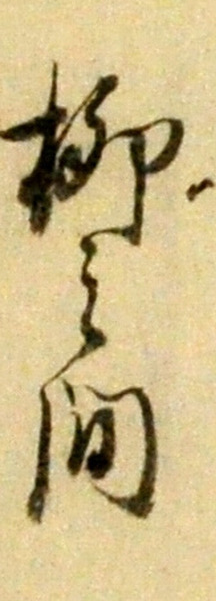柳之間
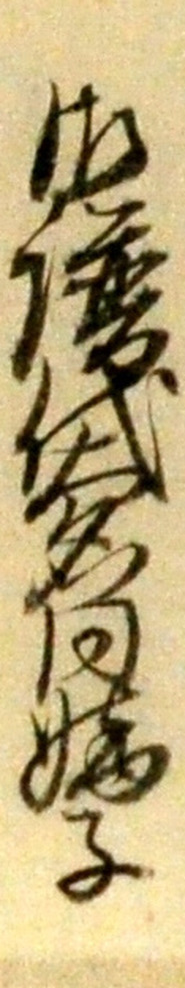御譜代大名同嫡子
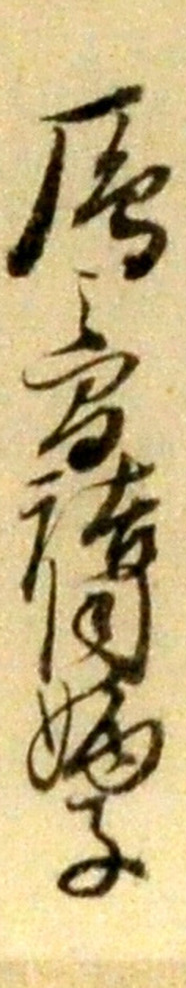鳫之間詰同嫡子
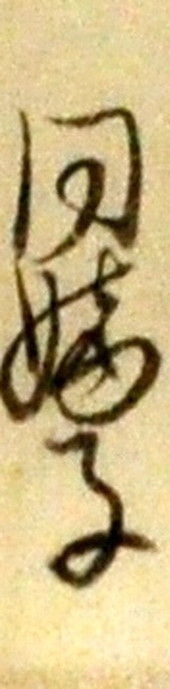同嫡子
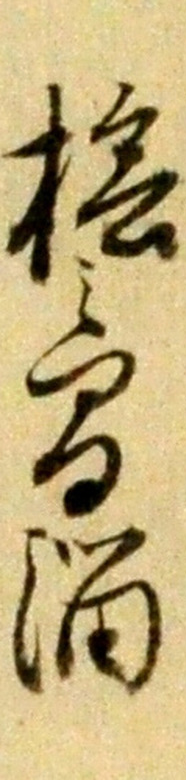桧之間溜
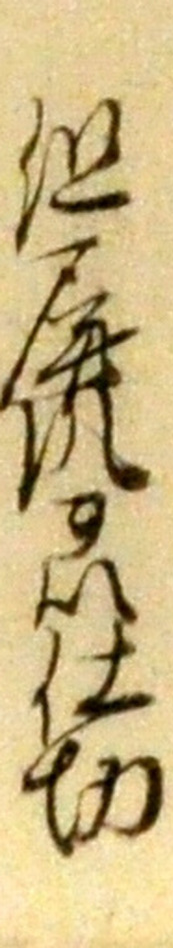但屏風ヲ以仕切
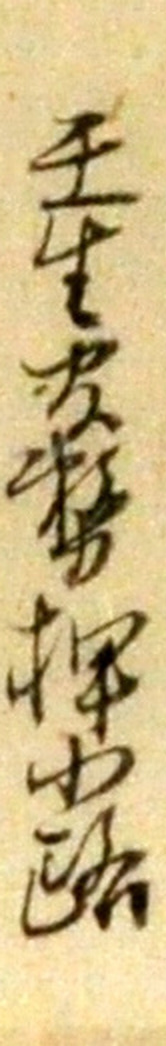壬生官務押小路
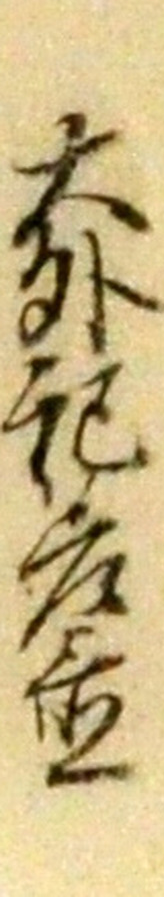大外記差置
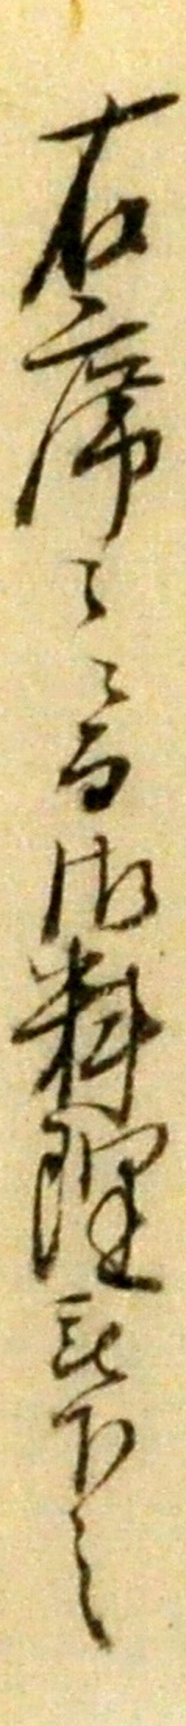右席々ニ而御料理被下之
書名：御馳走御能ノ節ノ留外
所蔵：伊那市立高遠町図書館・合同会社AMANE
